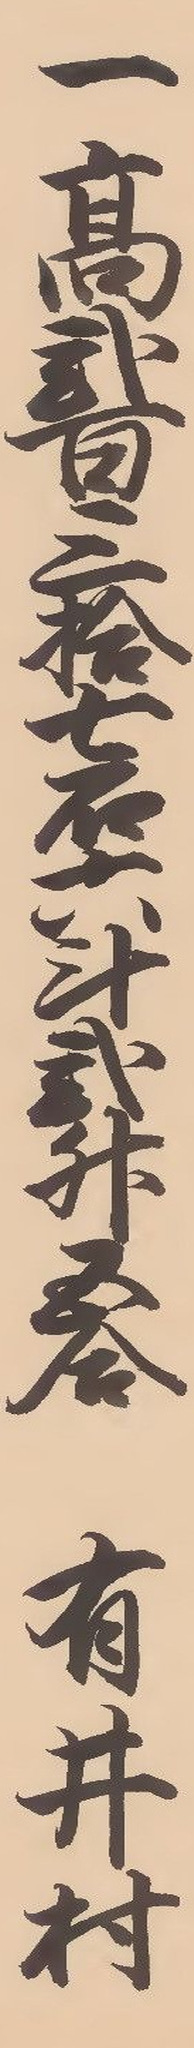一高弐百三拾七石六斗弐升五合有井村
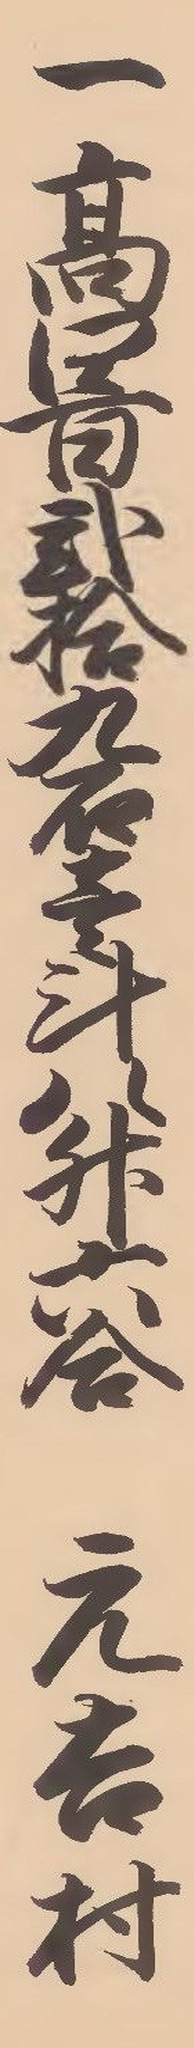一高四百弐拾九石壱斗八升六合元吉村

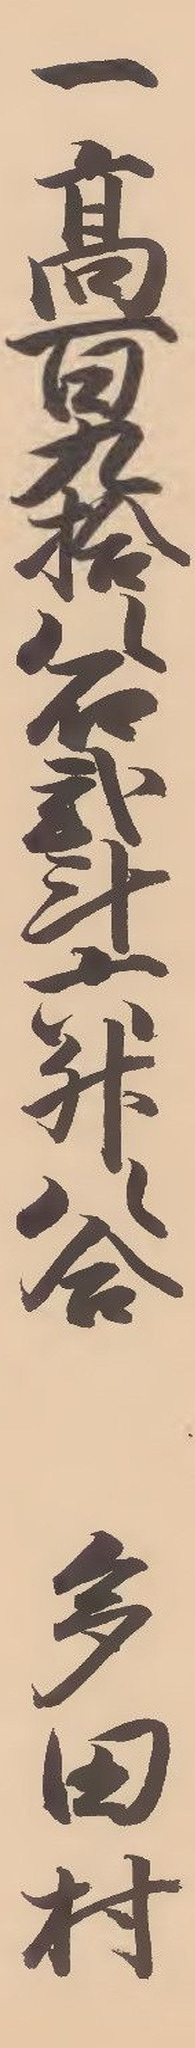一高百九拾八石弐斗六升八合多田村
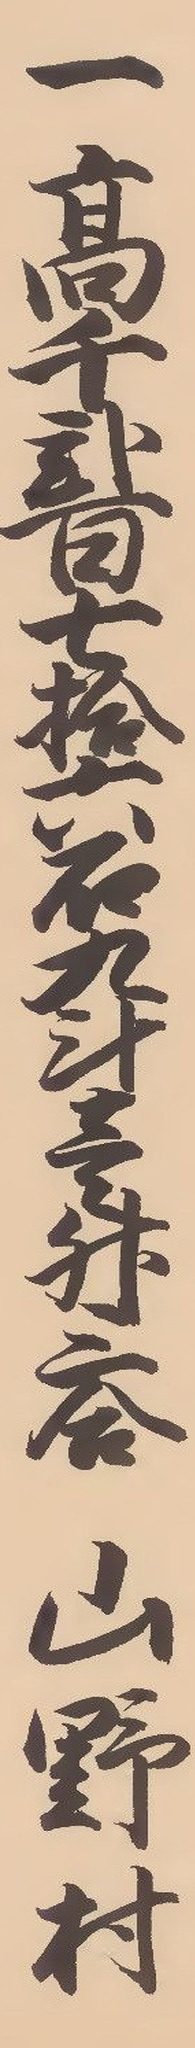一高千弐百七拾六石九斗壱升三合山野村
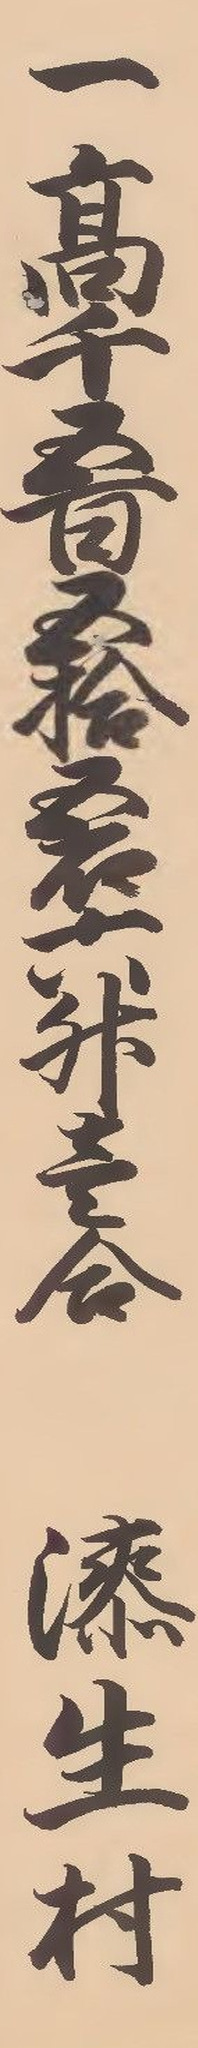一高千五百五拾五石六升壱合漆生村
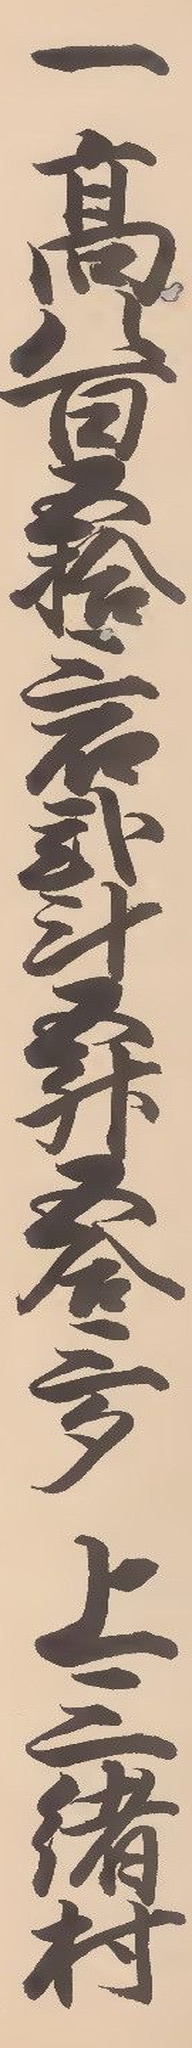一高八百五拾三石弐斗五升五合三勺上三緒村
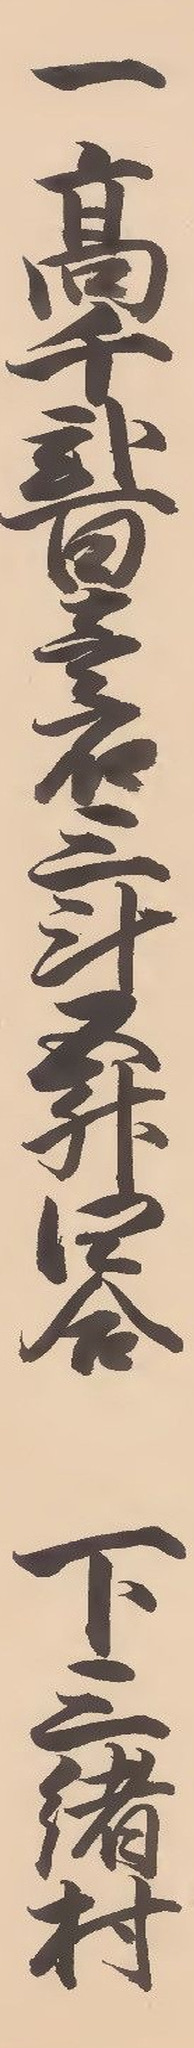一高千弐百壱石三斗五升四合下三緒村
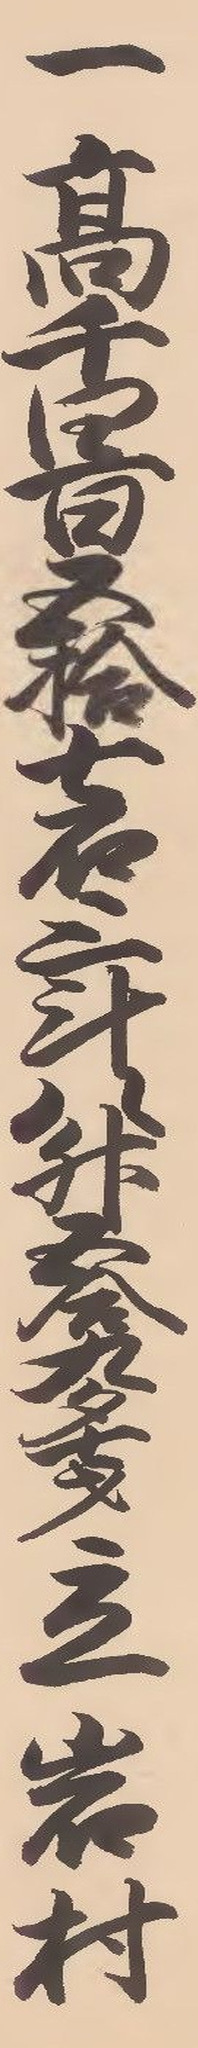一高千四百五拾七石三斗八升五合九勺七才立岩村

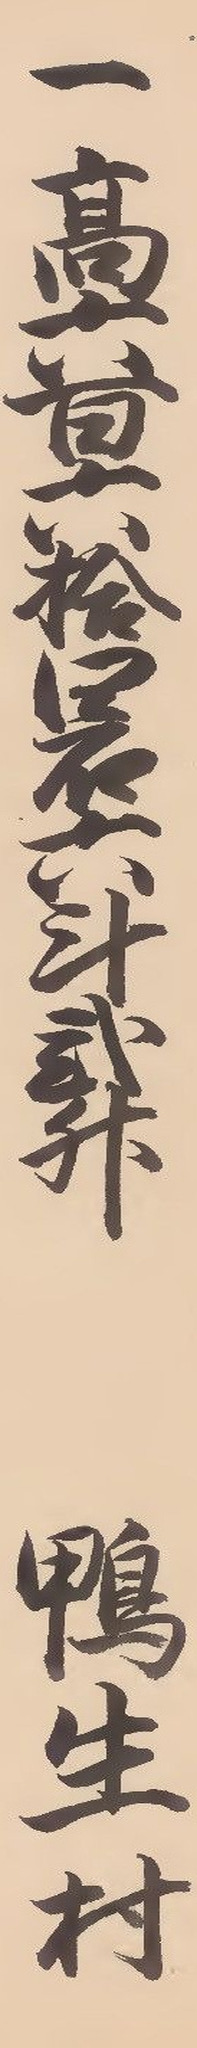一高六百六拾四石六斗弐升鴨生村
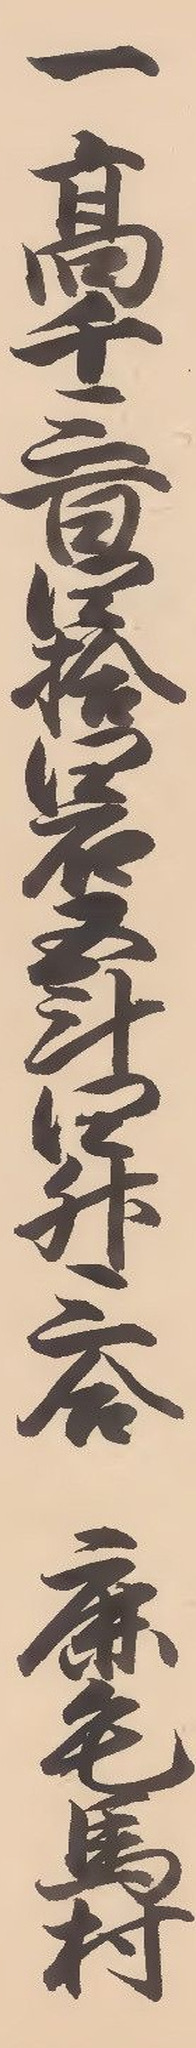一高千三百四拾四石五斗四升三合鹿毛馬村
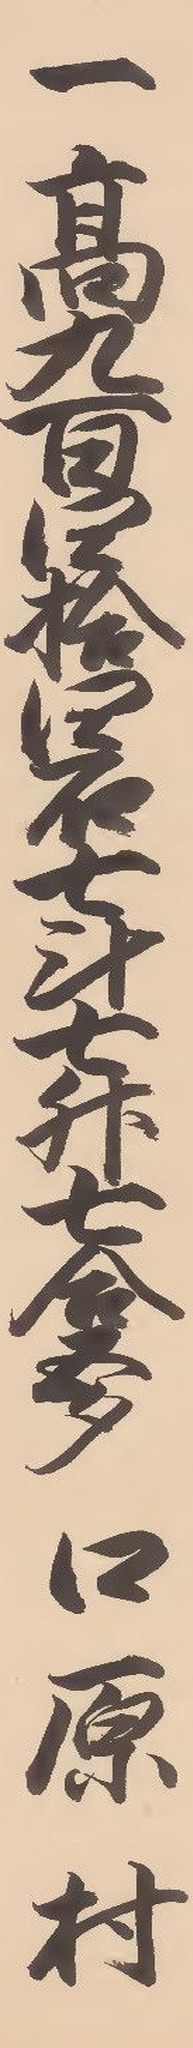一高九百四拾四石七斗七升七合五勺口原村
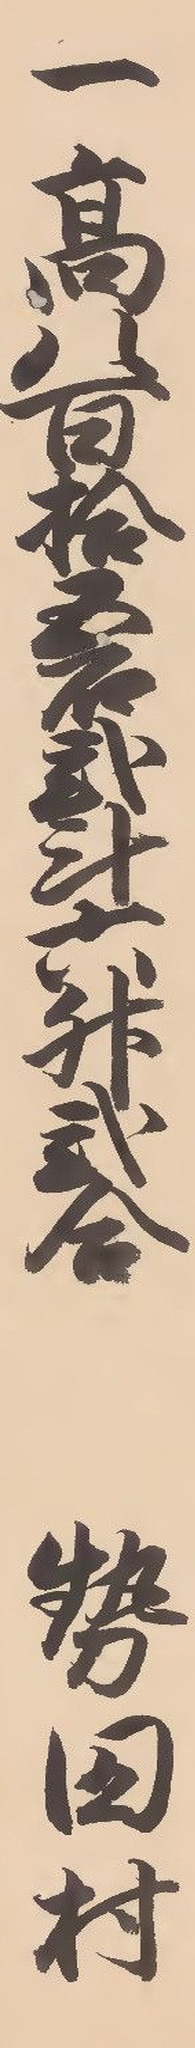一高八百拾五石弐斗六升弐合勢田村
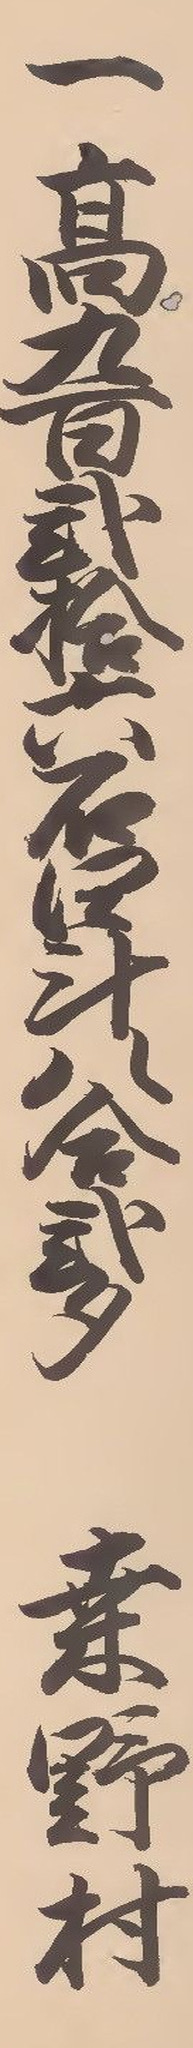一高九百弐拾六石四斗八合弐勺桑野村
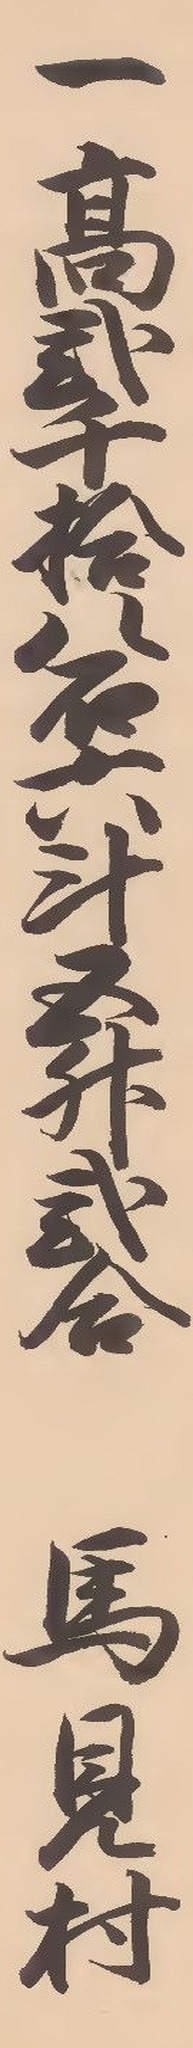一高弐千拾八石六斗五升弐合馬見村
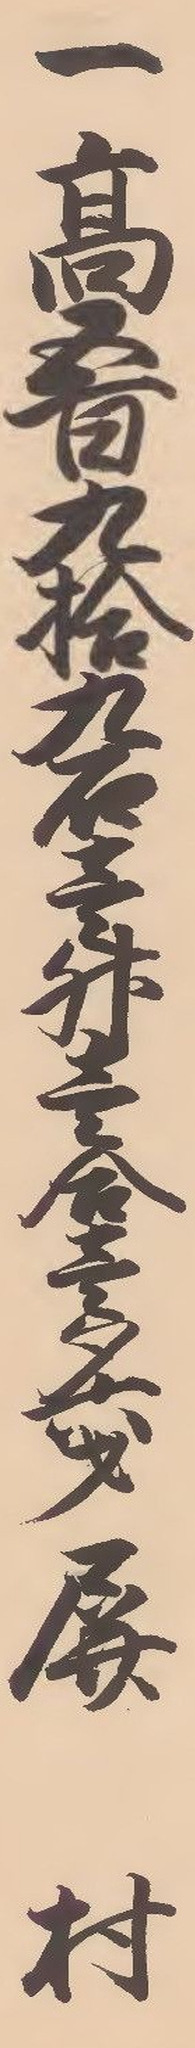一高五百九拾九石壱升壱合壱勺六才屏村

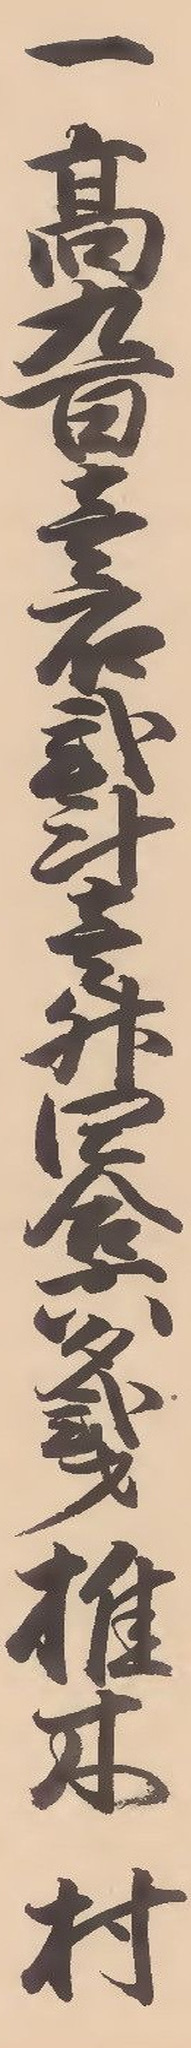一高九百壱石弐斗壱升四合六勺弐才椎木村
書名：筑前国郷帳
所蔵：国立公文書館 National Archives of Japan
